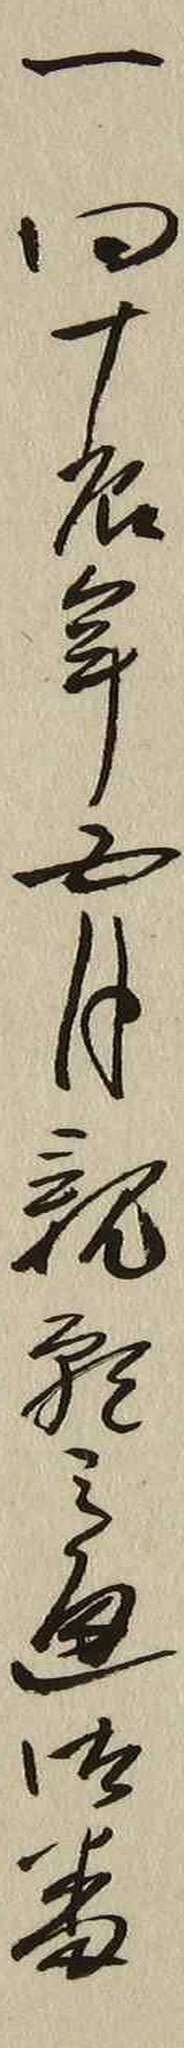一同十辰年五月親願之通御番
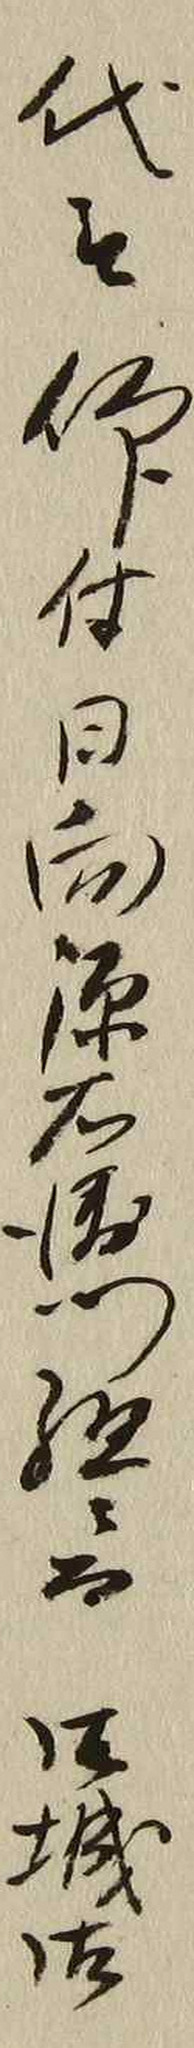代被仰付日向源右衛門組ニ而御城御
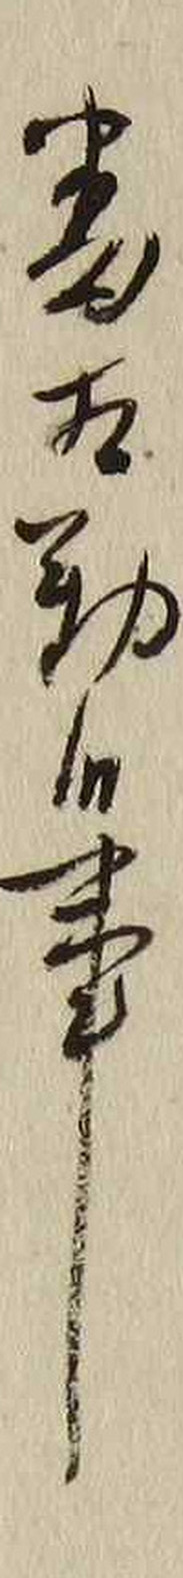番相勤候事
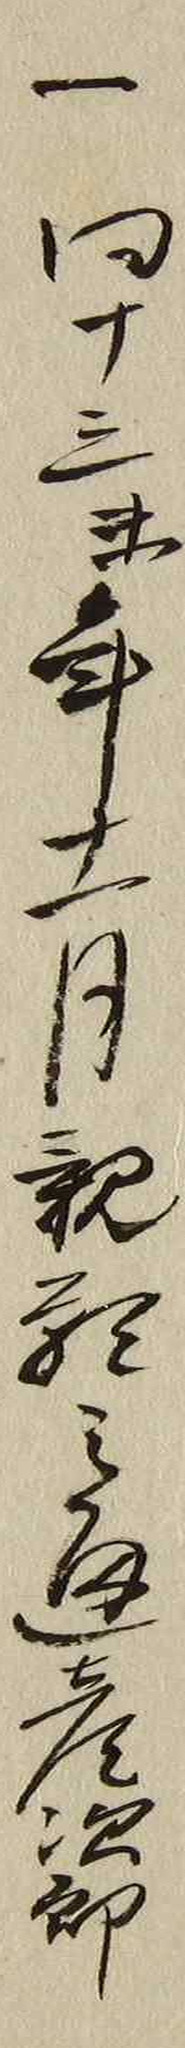一同十三未年十一月親願之通彦次郎
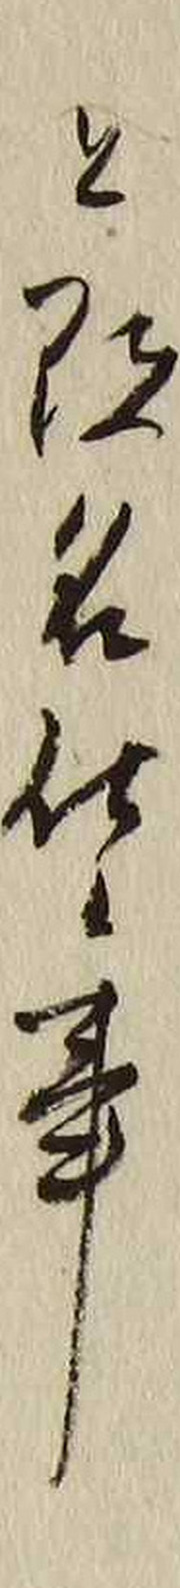と改名仕候事
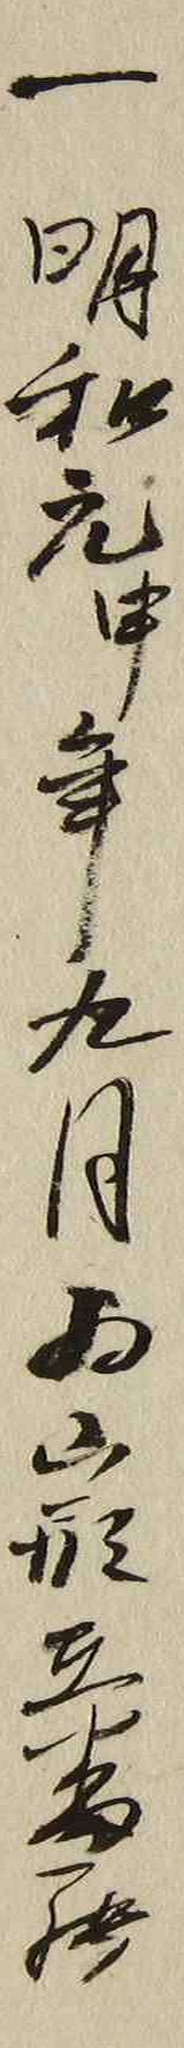一明和元申年九月為山形在番罷
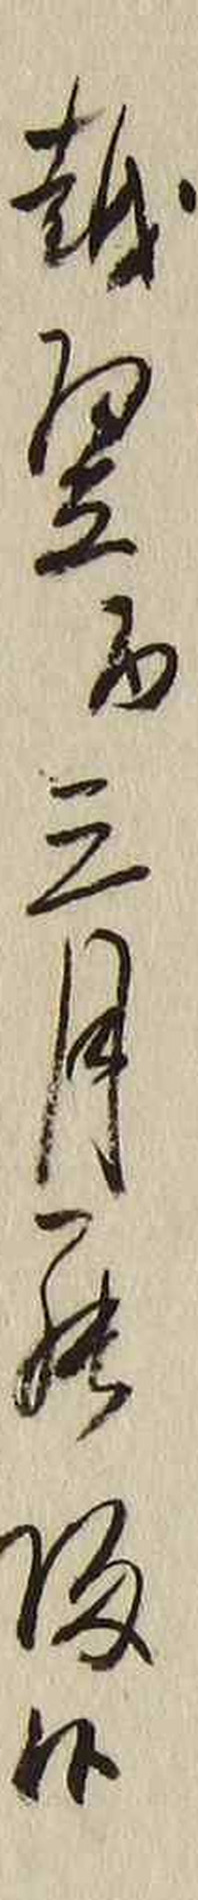越翌酉三月罷帰候
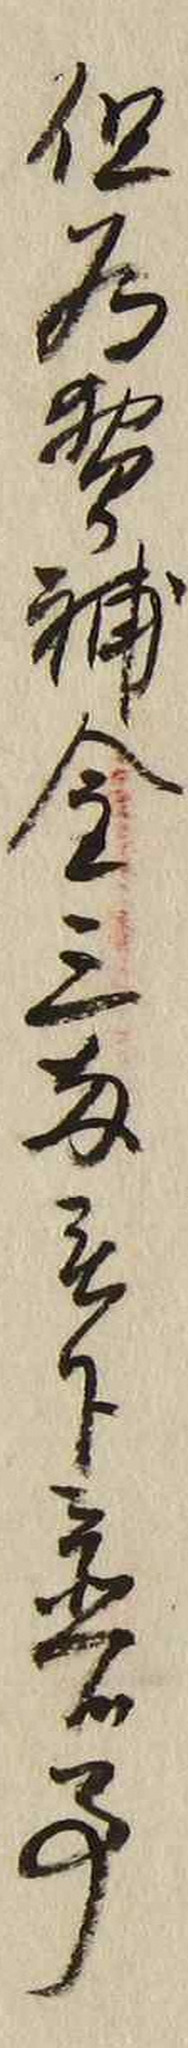但為費補金三両被下置候事

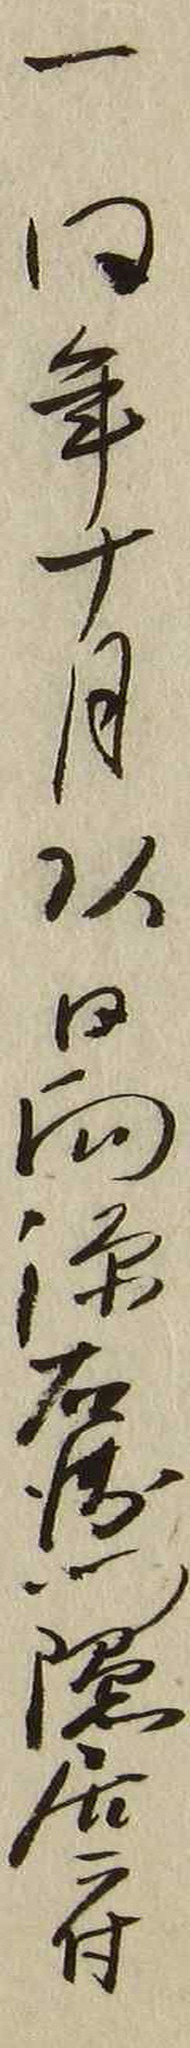一同年十月頭日向源右衛門隠居ニ付
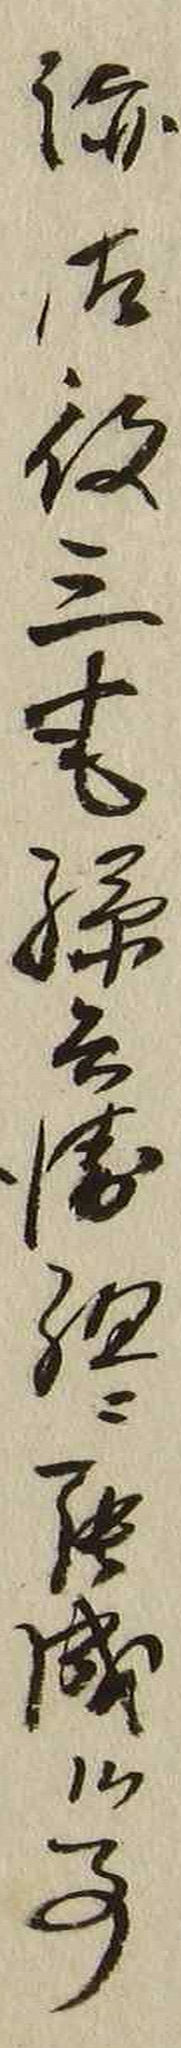跡御役三宅孫兵衛組ニ罷成候事
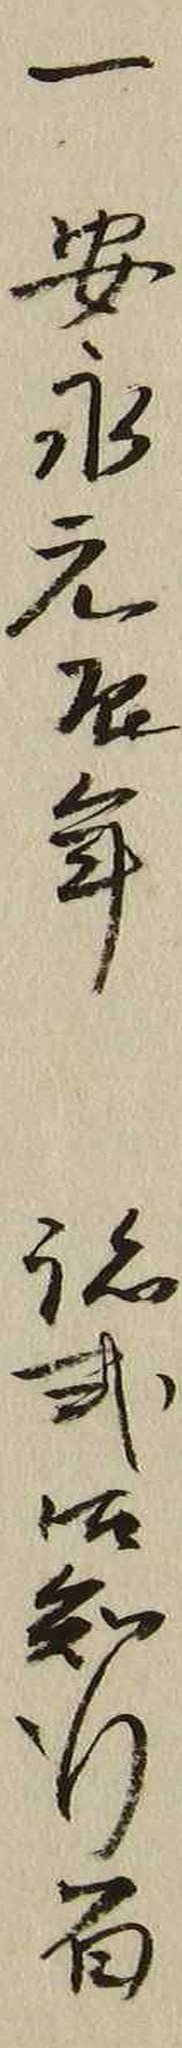一安永元辰年跡式御知行百
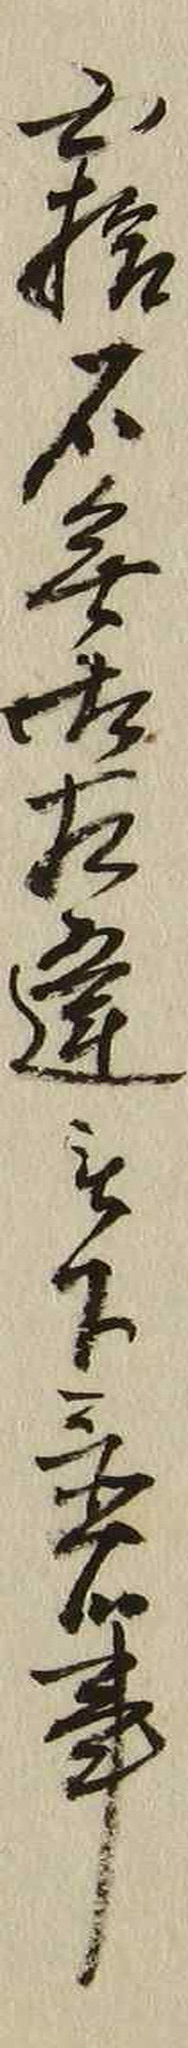五拾石無御相違被下置候事
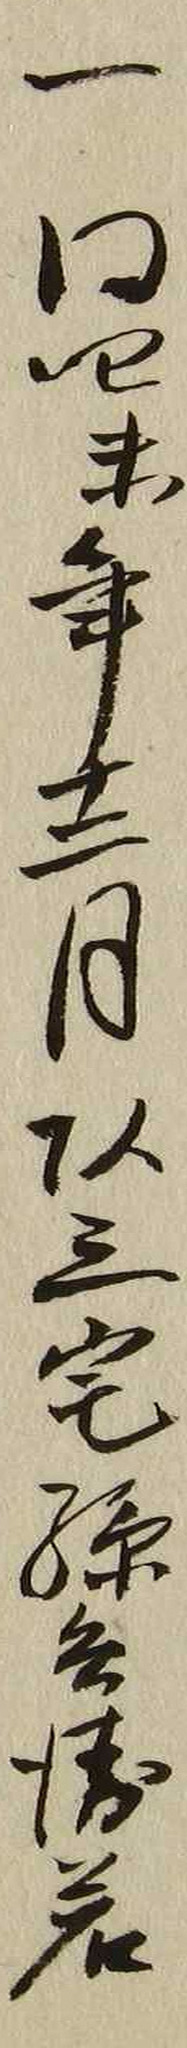一同四未年三月頭三宅孫兵衛若
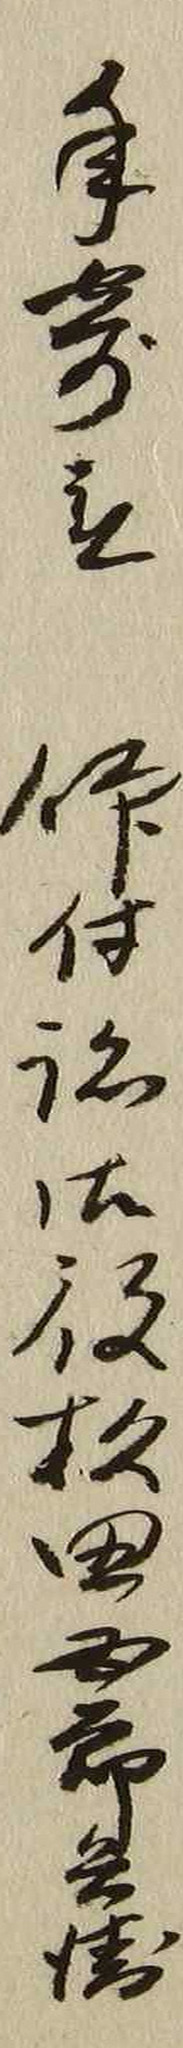年寄被仰付跡御役杉田五郎兵衛
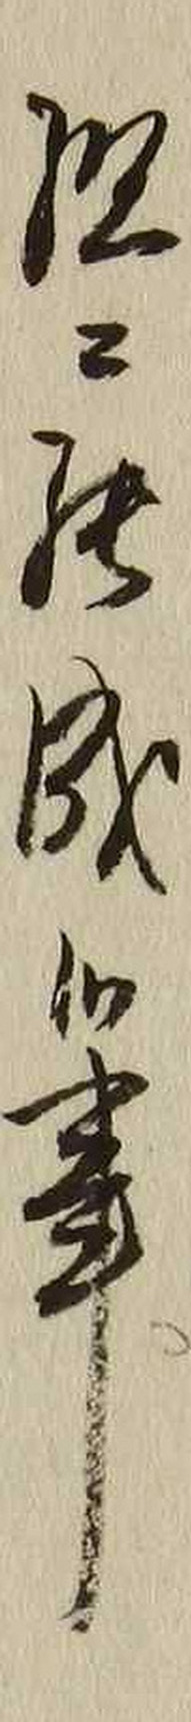組ニ罷成候事
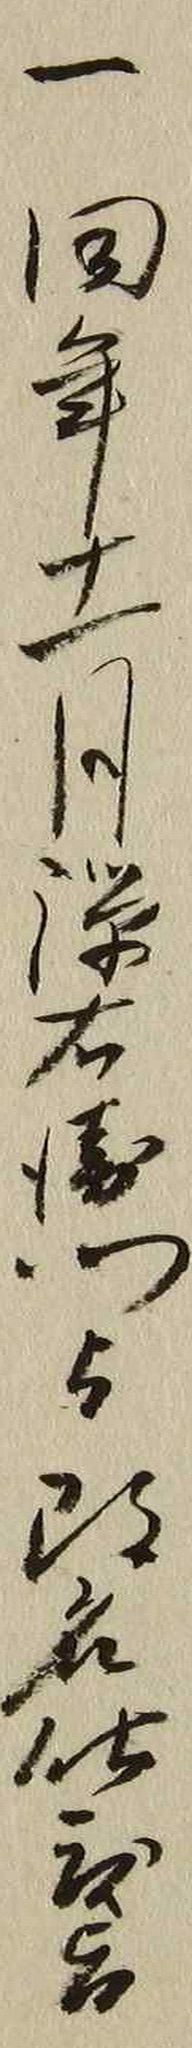一同年十一月弾右衛門与改名仕度旨
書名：諸士系譜　巻之346　も之部2
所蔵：会津若松市立会津図書館
